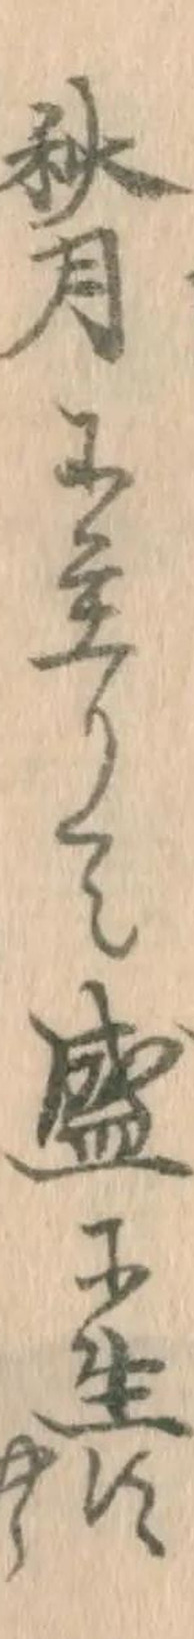秋月に至りて盛に生す
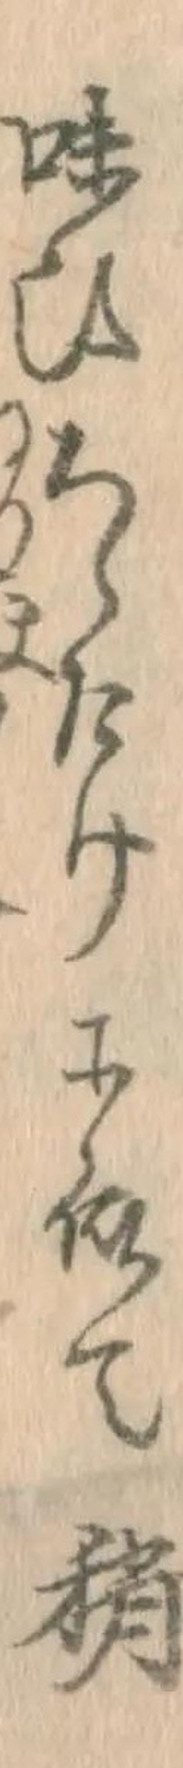味ひちゝたけに似て稍
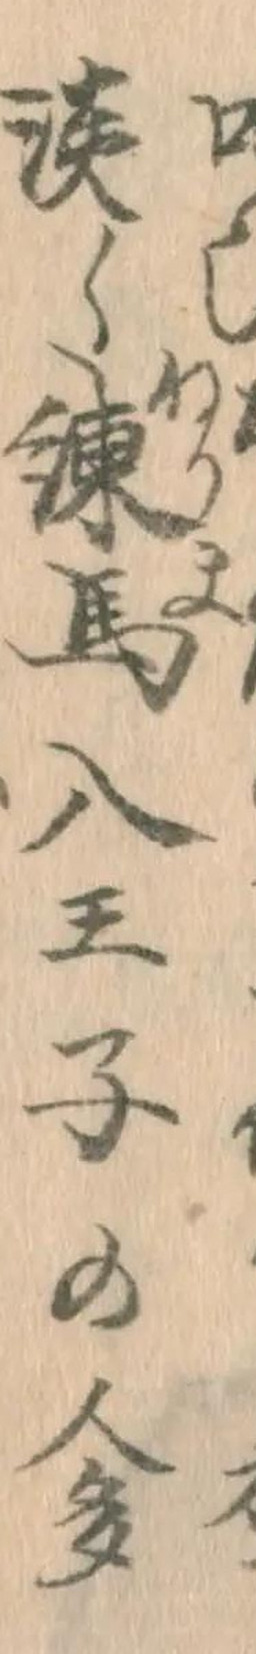淡く練馬八王子の人多
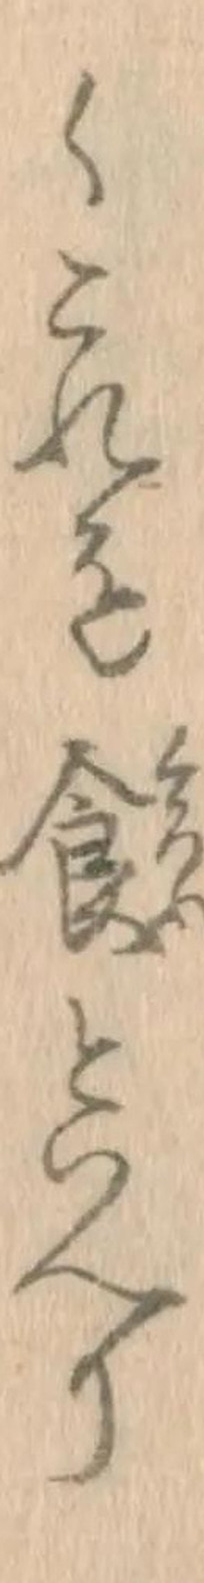くこれを食といへり
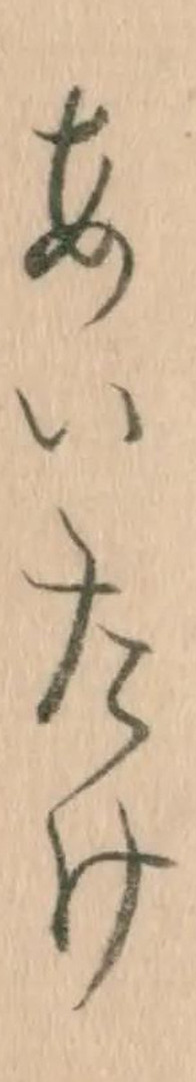あいたけ
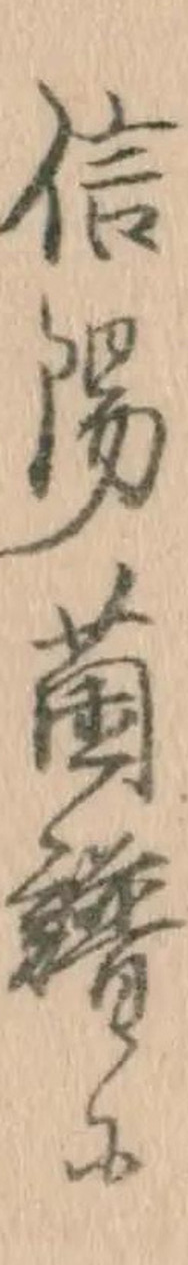信陽菌譜に
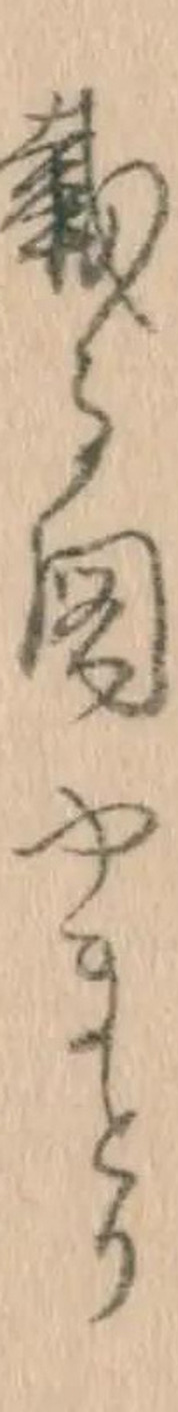載る図やまとり
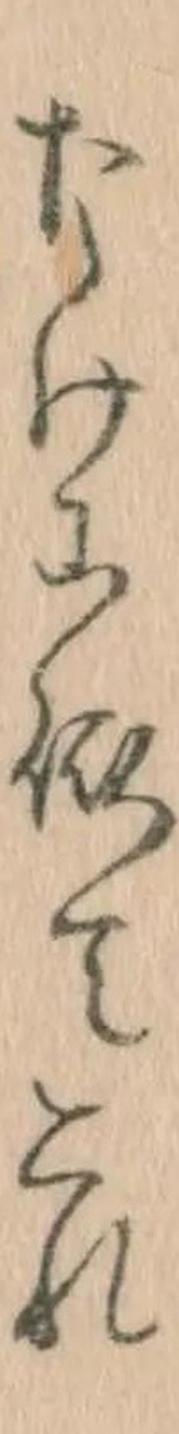たけに似てこれ
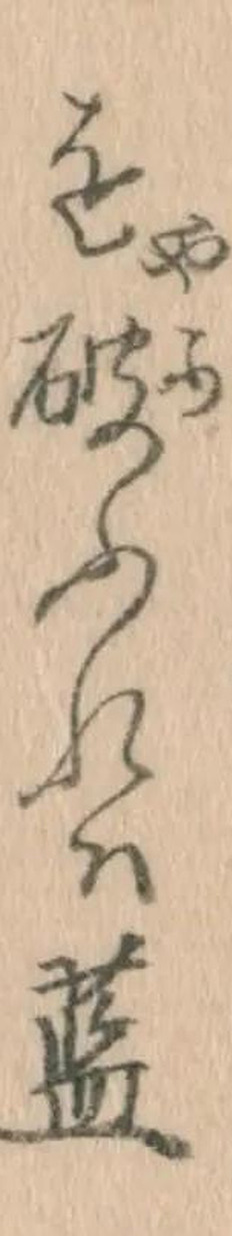を破ふれは藍
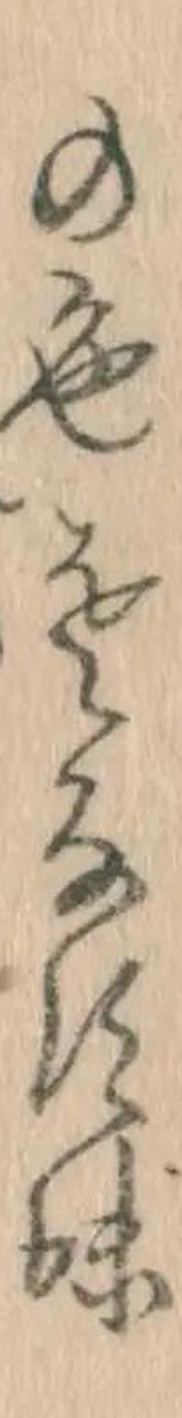の色をなす味
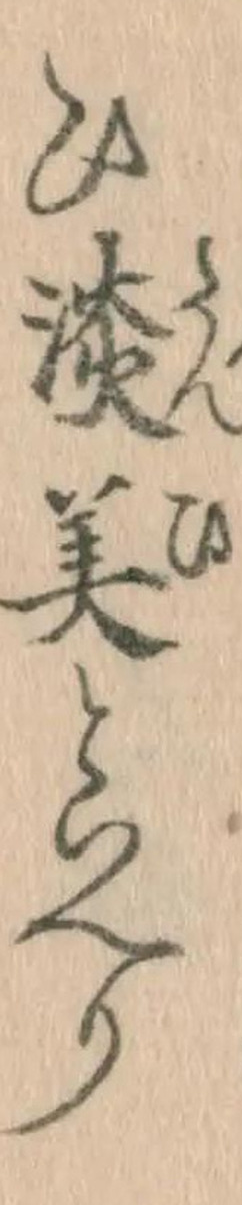ひ淡美といへり

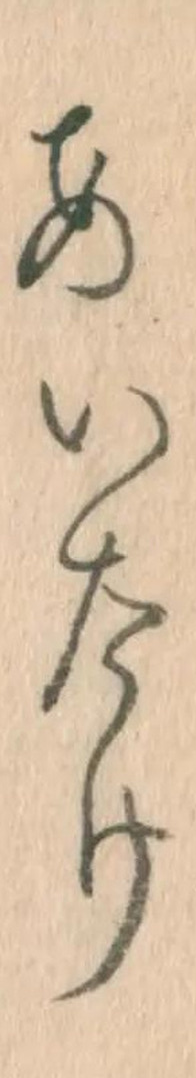あいたけ
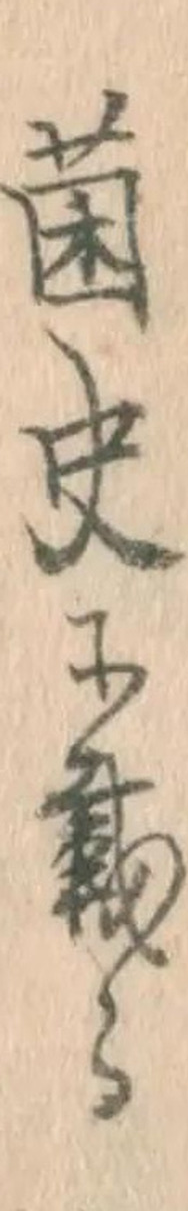菌史に載る
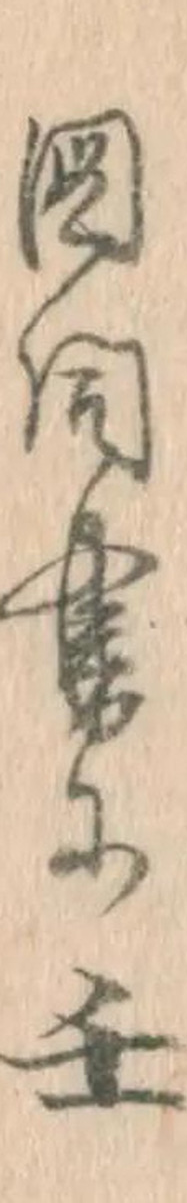図同書に壬
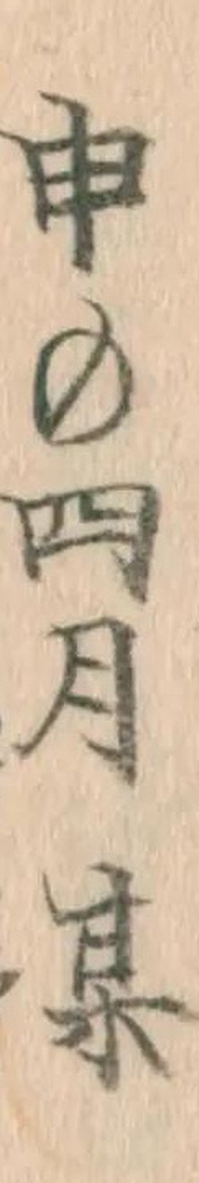申の四月某
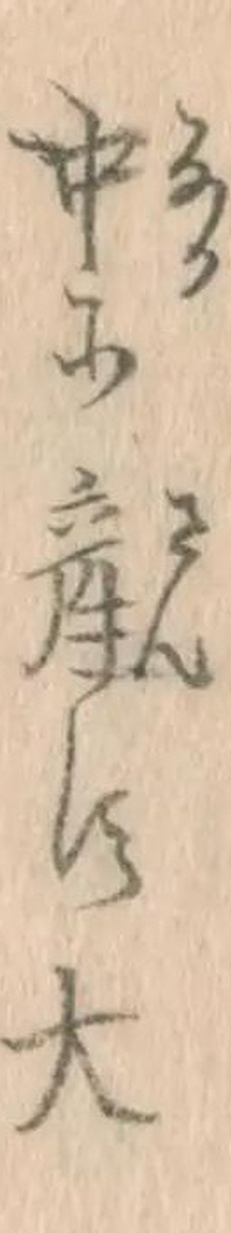中に産す大
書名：本草図譜. 巻55-57
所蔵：国立国会図書館 National Diet Library, JAPAN
